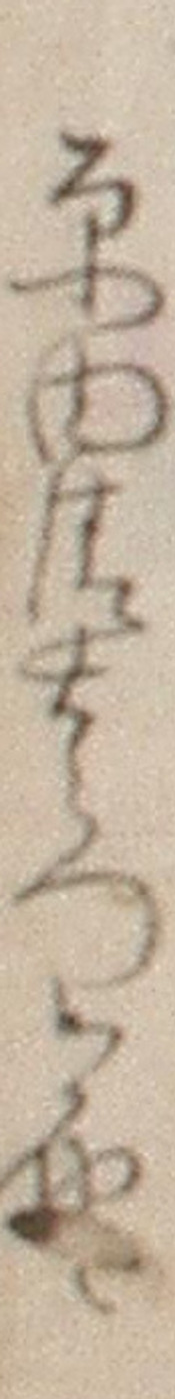原田清右衛門御届

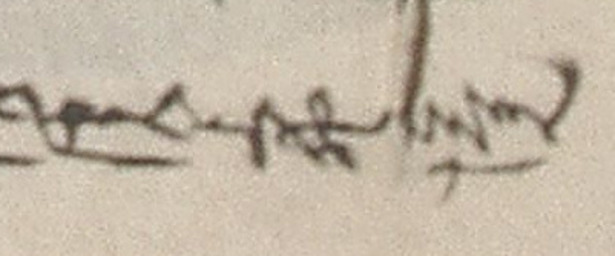武蔵上野境

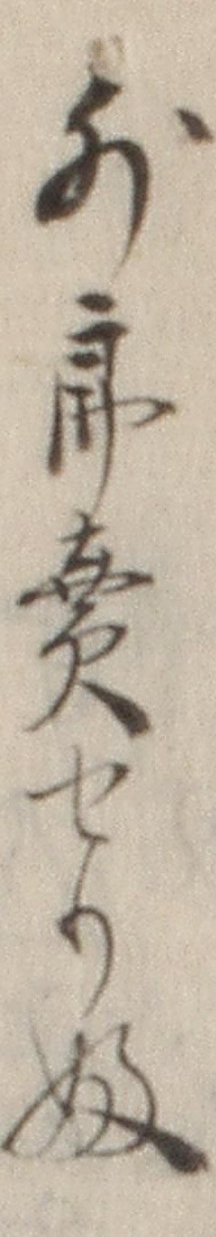外郎売セリふ
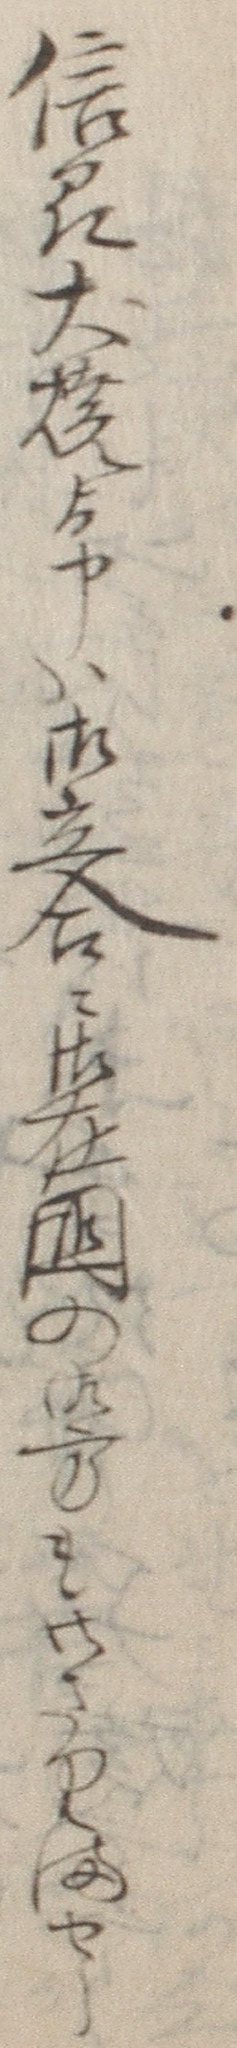信州大焼と申は御立合ニ御在国の御方もささりませ
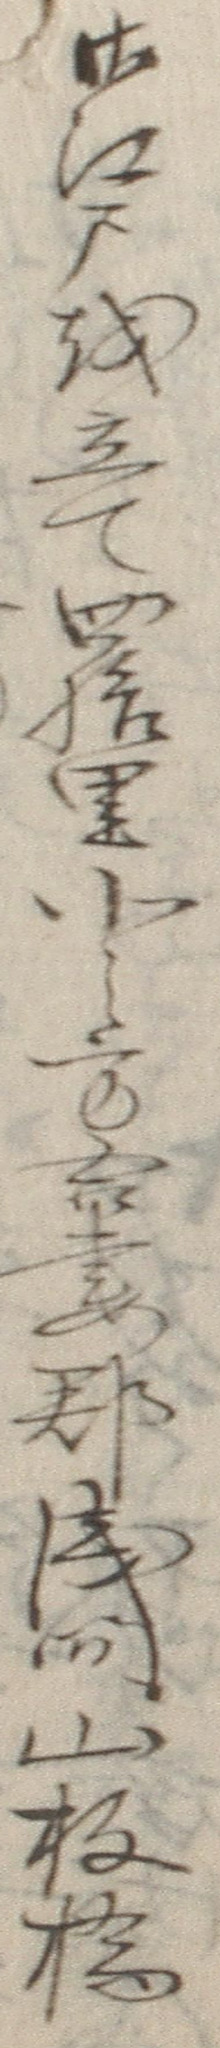御江戸を立て四拾里北之方吾妻郡浅間山板橋
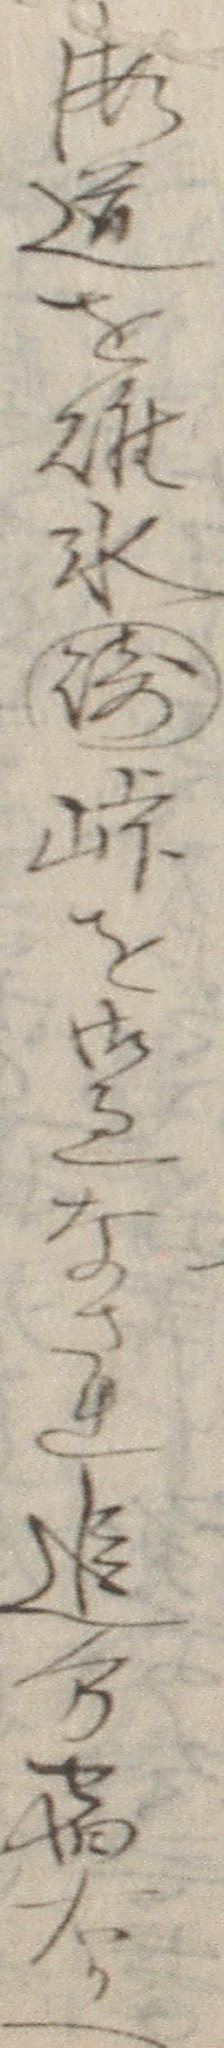海道を碓氷碕峠を御過なされ追分宿右りへ
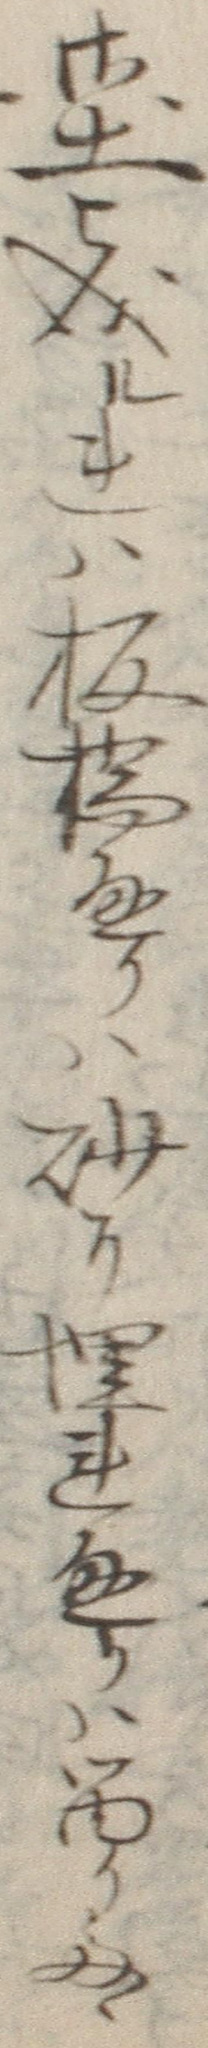御出被成ルれは板橋通りは砂に埋れ通りは留り多く
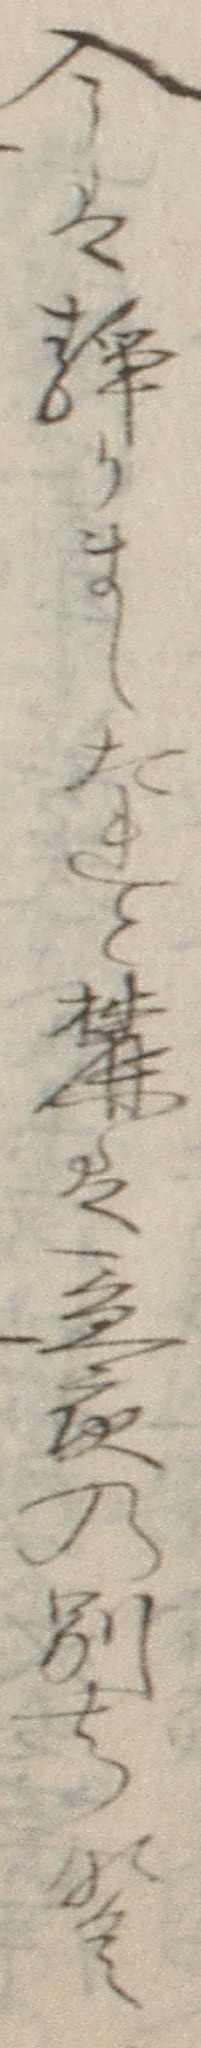今は静りましたれと麓は昼夜の別はなく
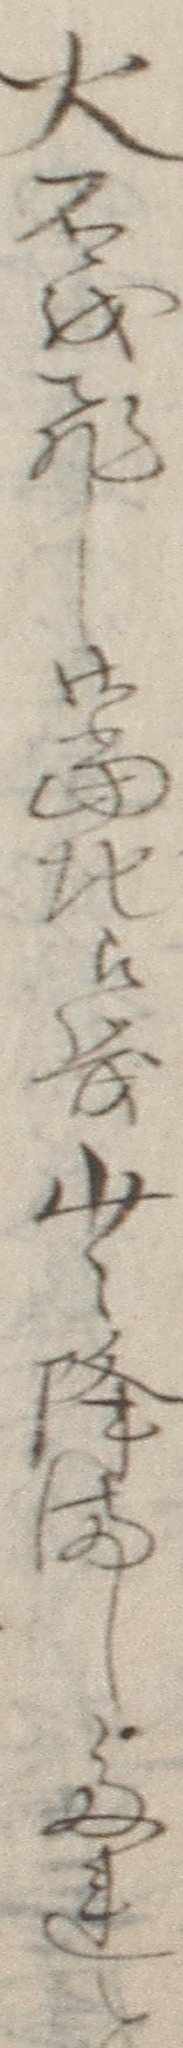火石を飛し御当地えも少々降ましたれと
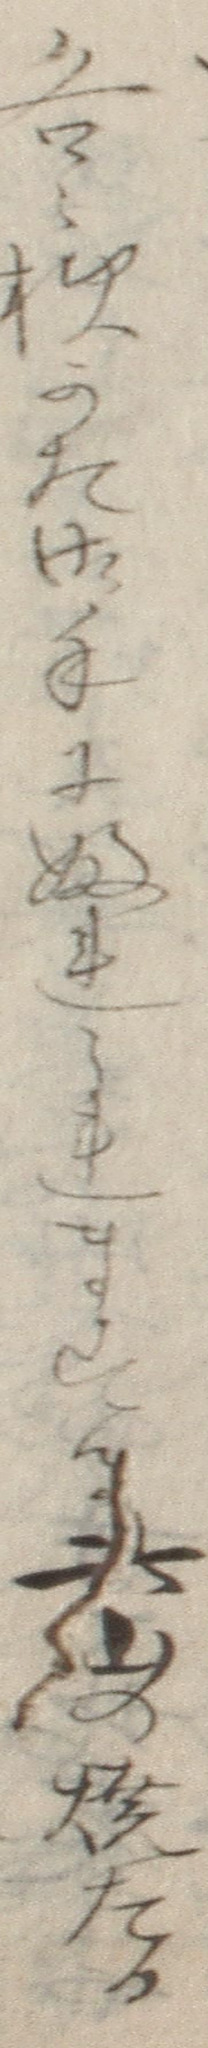各々様かた御手にふれられまする此山の焼たる
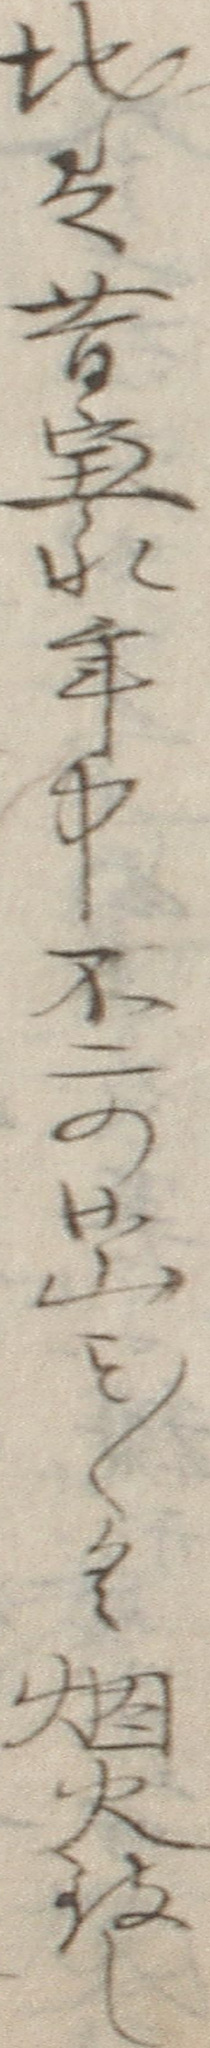地は昔宝永年中不二の御山こと〳〵く烟火致し
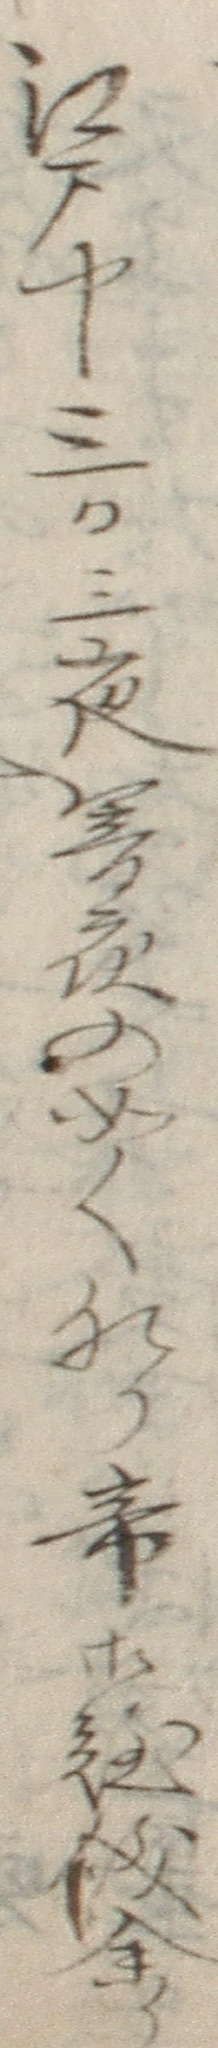江戸中三日三夜闇夜の如くなり帝御難儀余り
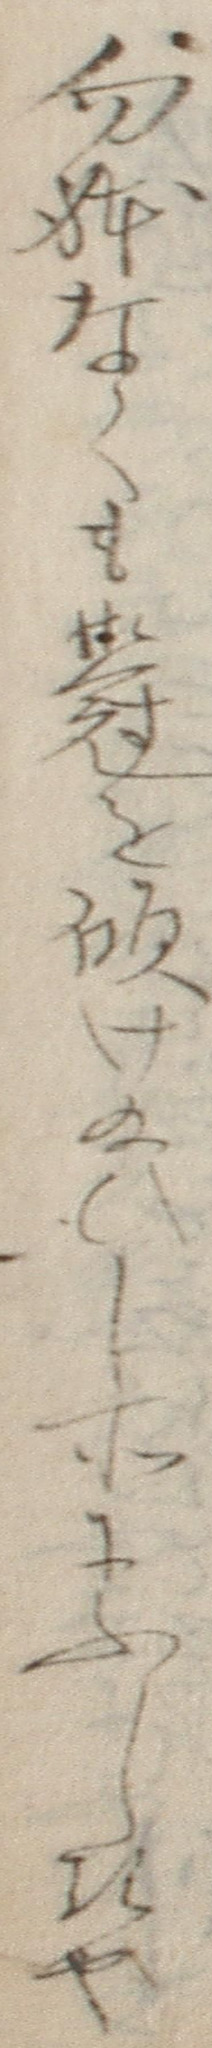勿躰なくも御冠を傾け給ひし所にふしき也

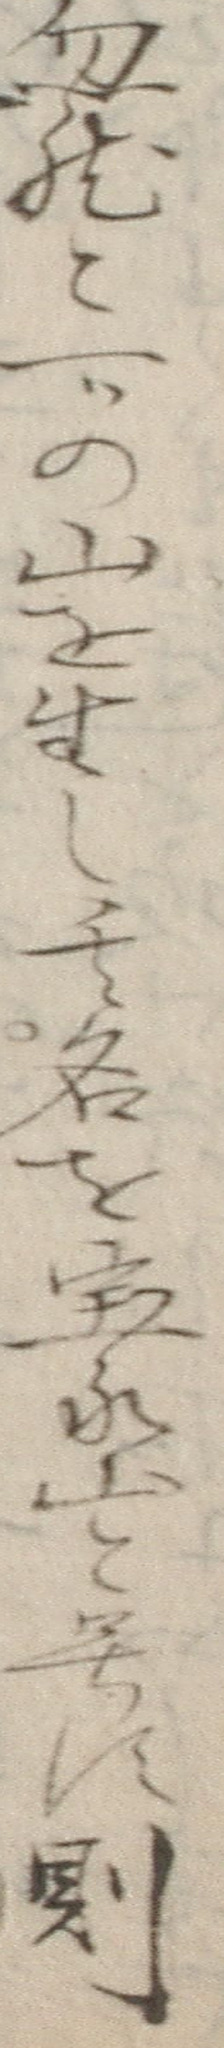忽然とかの山を生し其名を宝永山と号す則
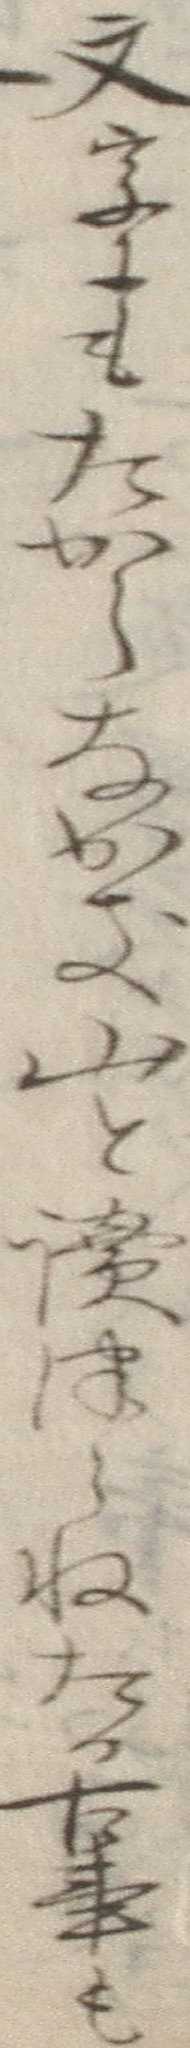文字にもたからなかき山と読つらねたる古事も
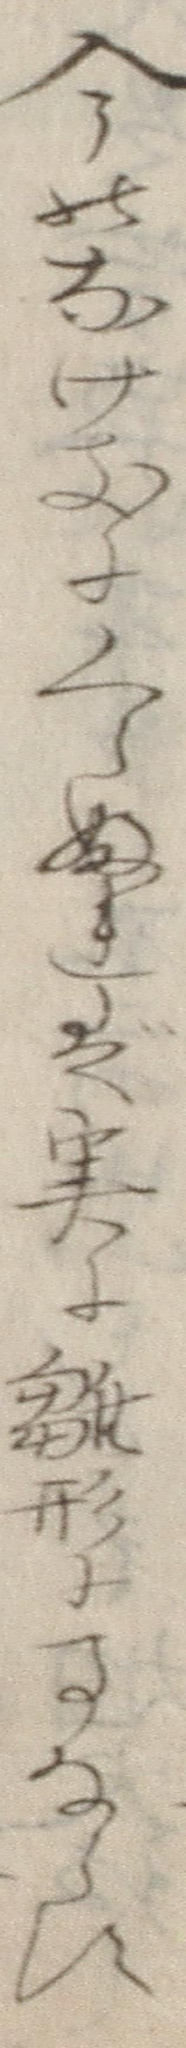今のなけきにくらふれば実に雛形に事ならす
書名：[諸国災害記録]
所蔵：東京大学地震研究所図書室 Earthquake Research Institute Library, The University of Tokyo, JAPAN
